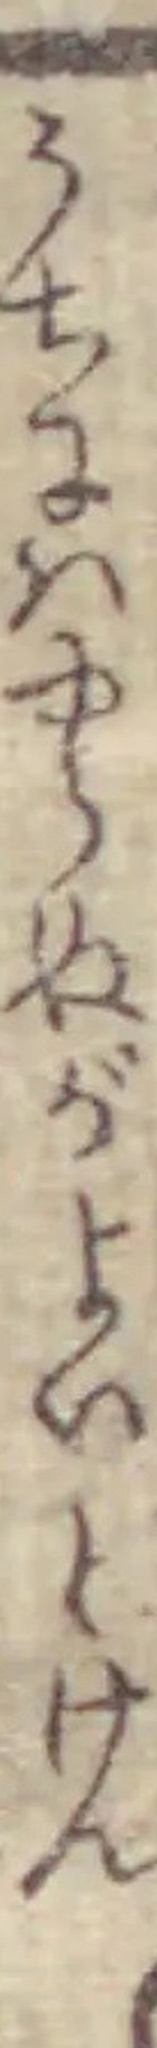うちにはやらぬがよいとけん
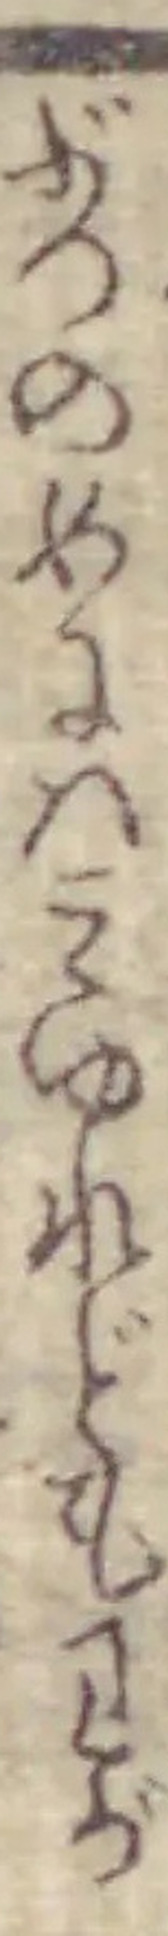ぶつのめにはみゆれどもわが
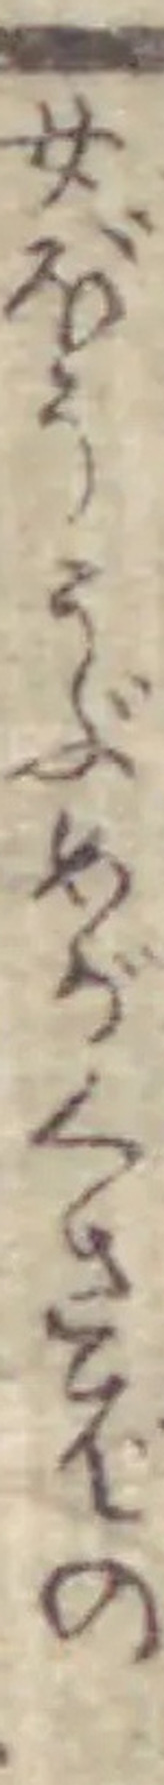女ぼううぶめがくさばの
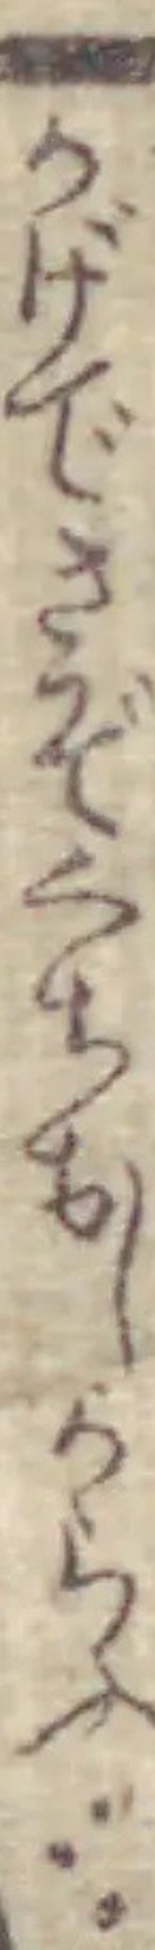かげでさぞくちおｓからふ
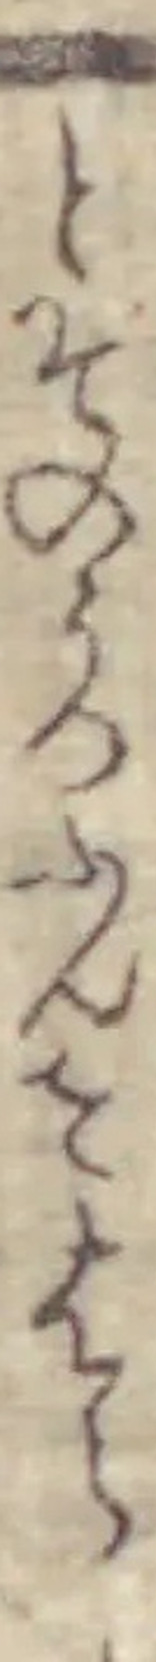とそのうつふんをはら
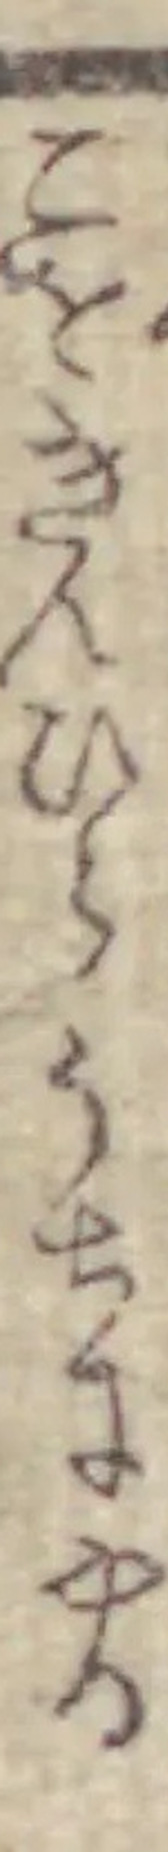こをきんひらうちにやる
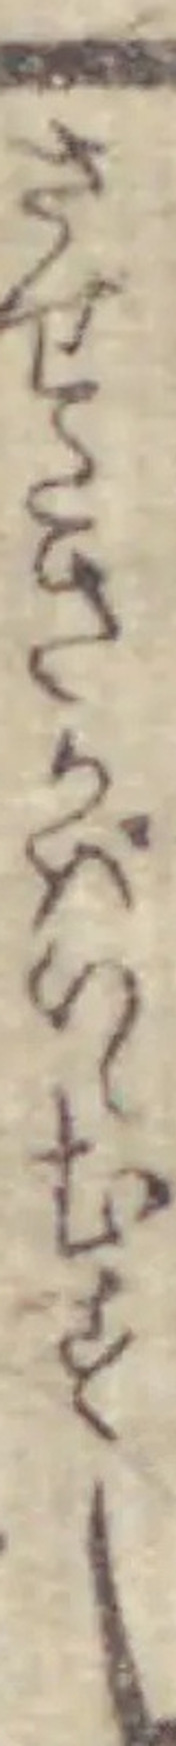させたきかはいゝむす
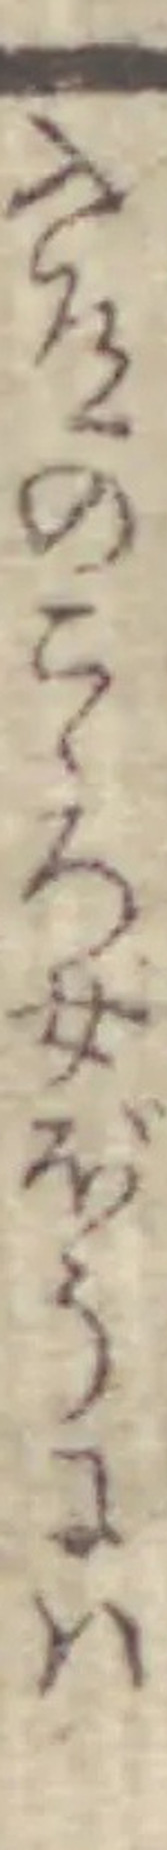入道のこゝろ女ぼうには
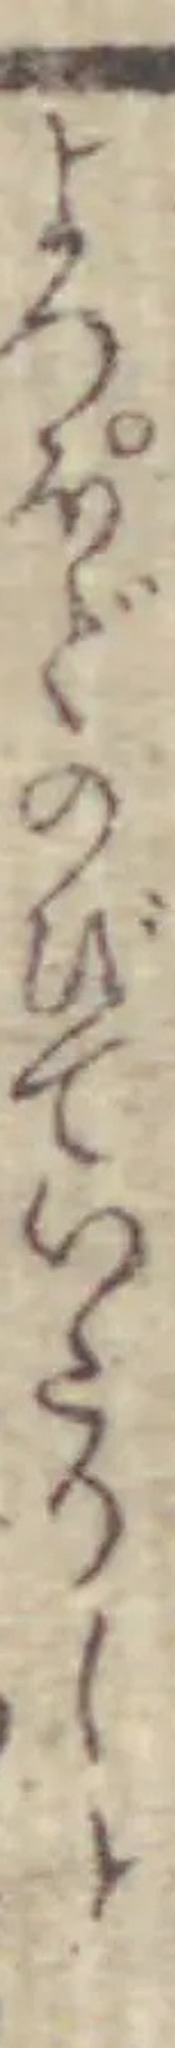よつぽどのびていたりしと
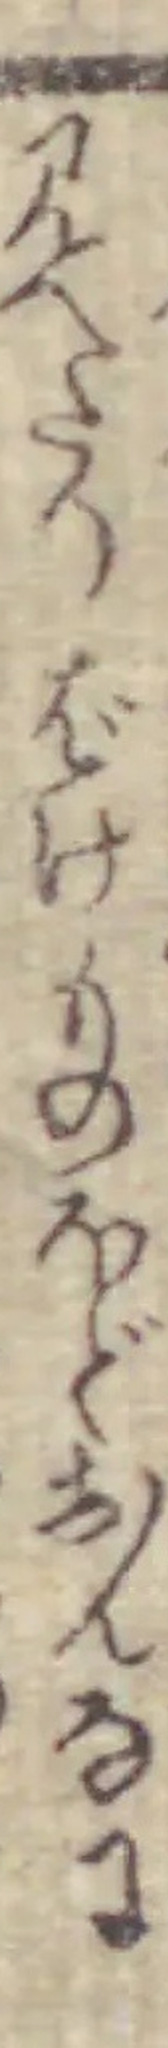見へたりばけものほどおんなに
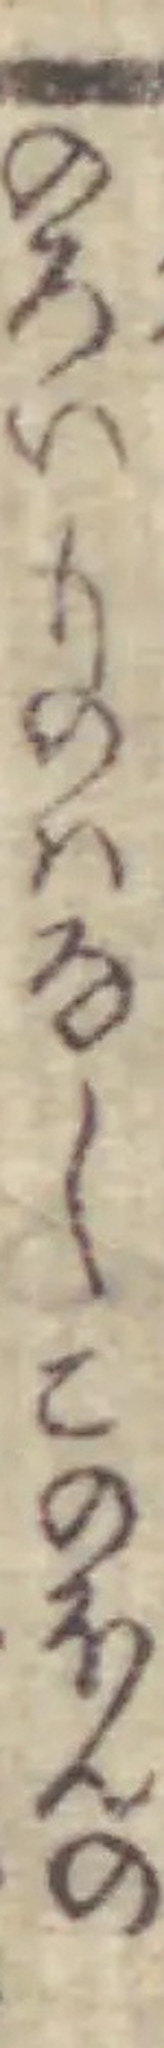のろいものはなしこのほんの
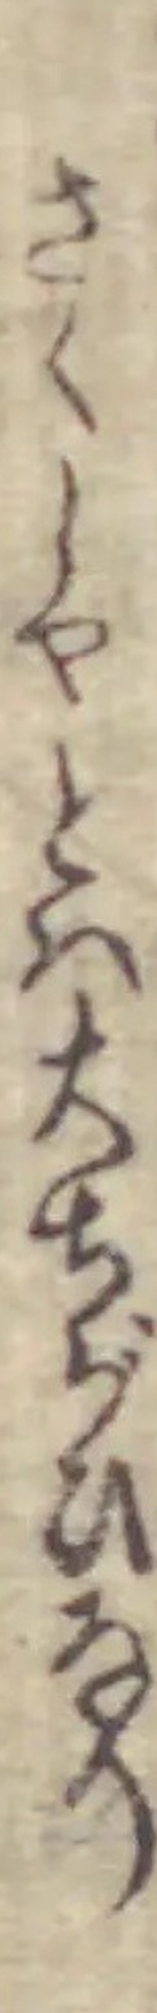さくしやとは大ちがひなり
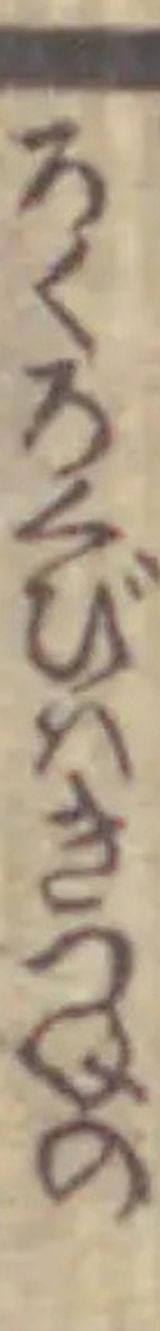ろくろくびはきつねの
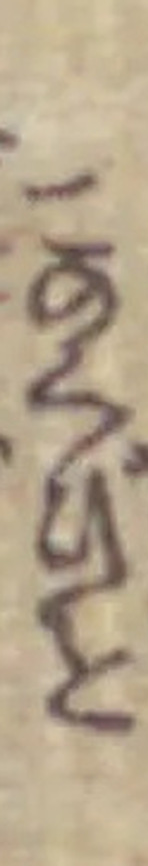このくびを
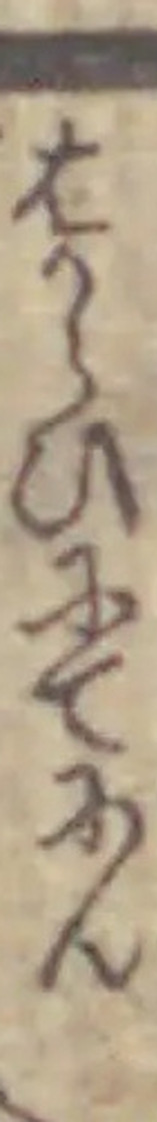はからひにてにん
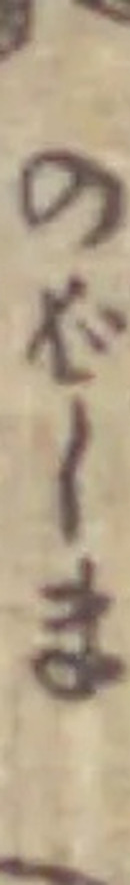のばしま
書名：化物敵討 2巻
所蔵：国立国会図書館 National Diet Library, JAPAN
